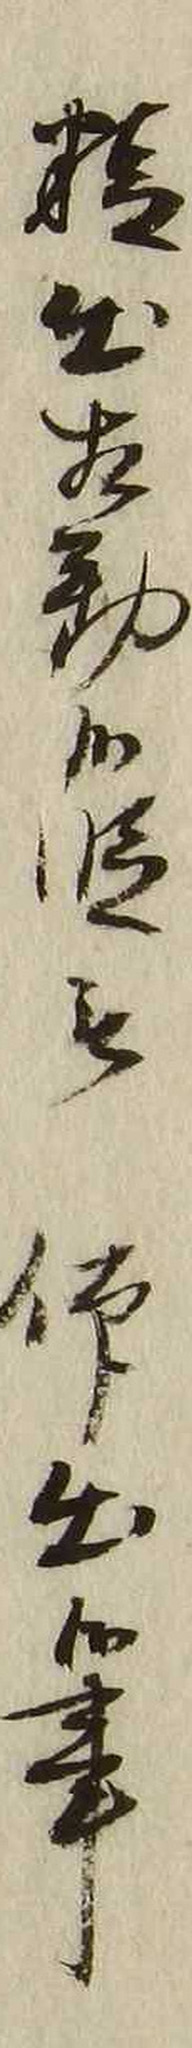精出相勤候段被仰出候事
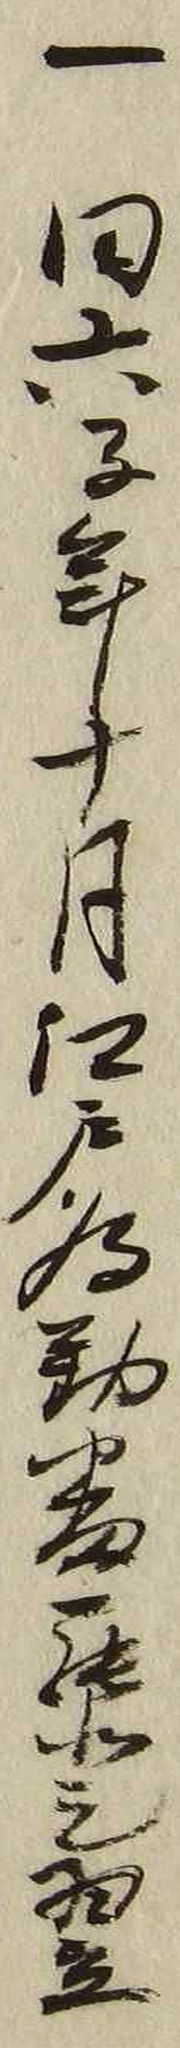一同六子年十月江戸為勤番罷登翌
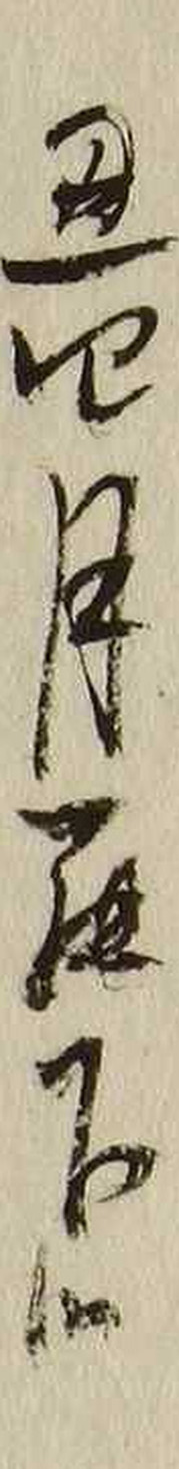丑四月罷下候
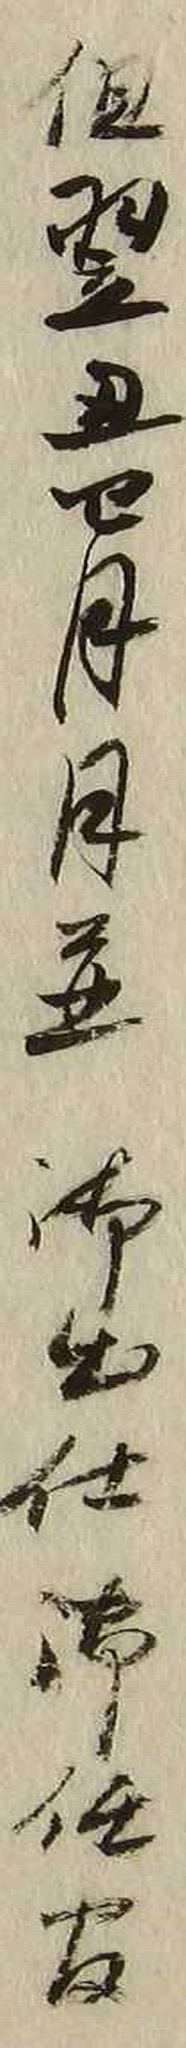但翌丑四月月並御出仕御任官
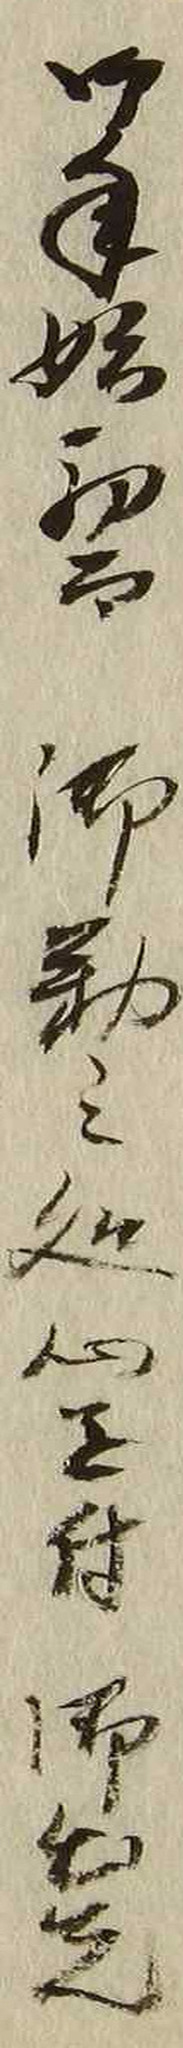御手始初而御勤之処心を付御出先
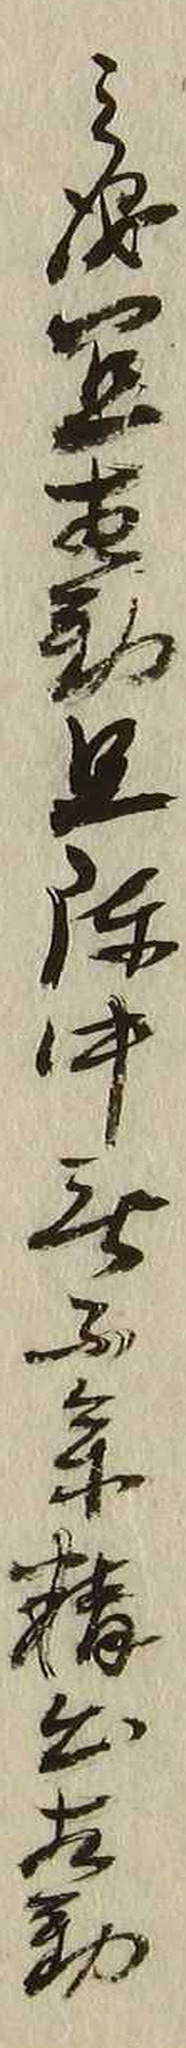之儀宜相勤且陣中無不参精出古勤
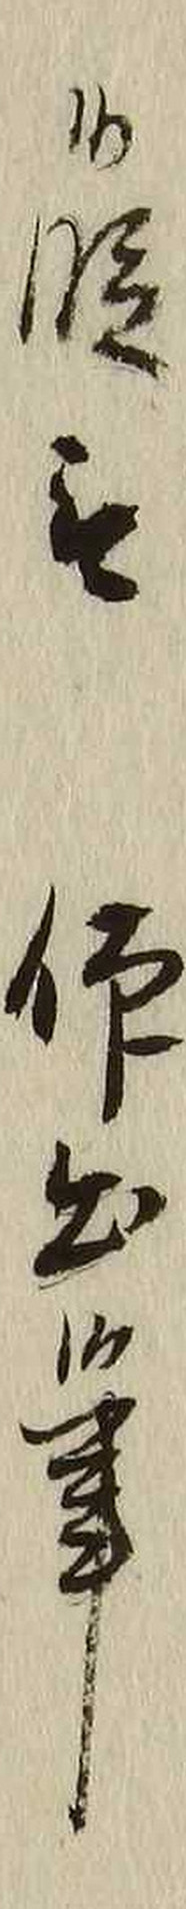候段被仰出候事
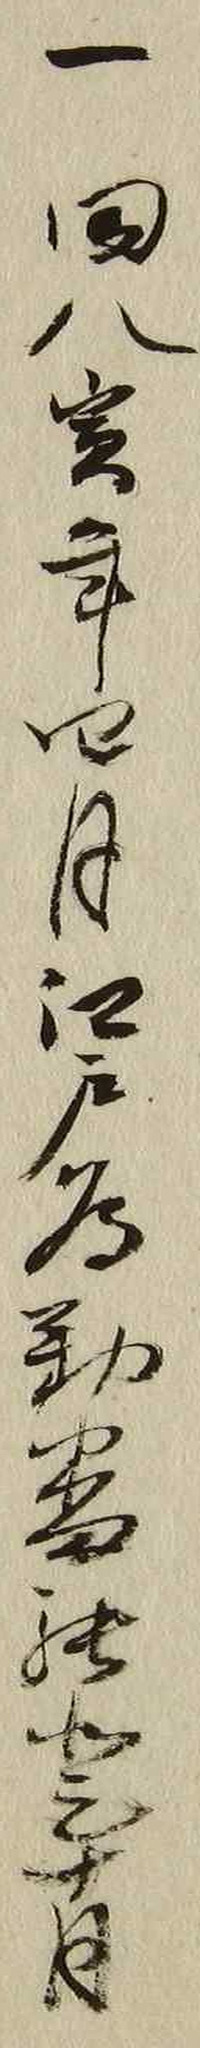一同八寅年四月江戸為勤番罷登十月
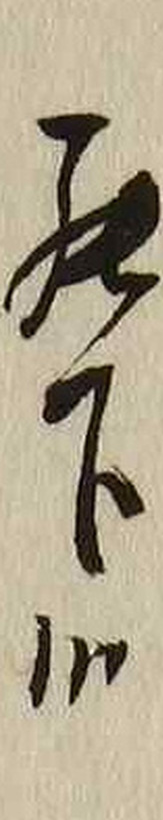罷下候
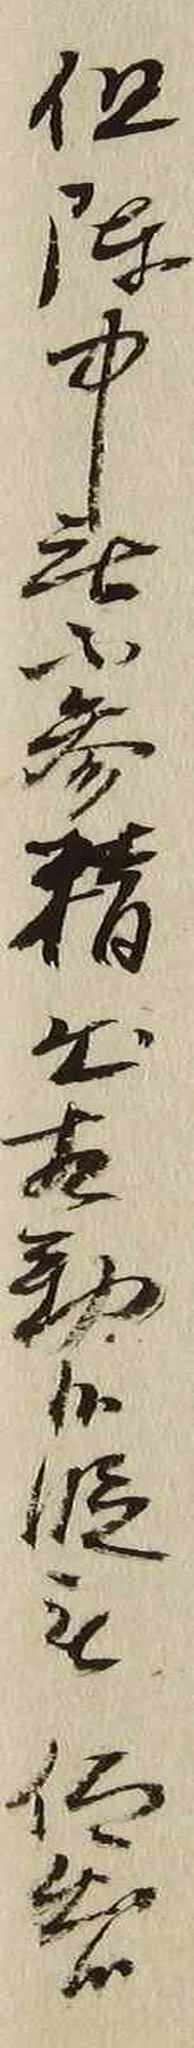但陣中無不参精出相勤候段被仰出候
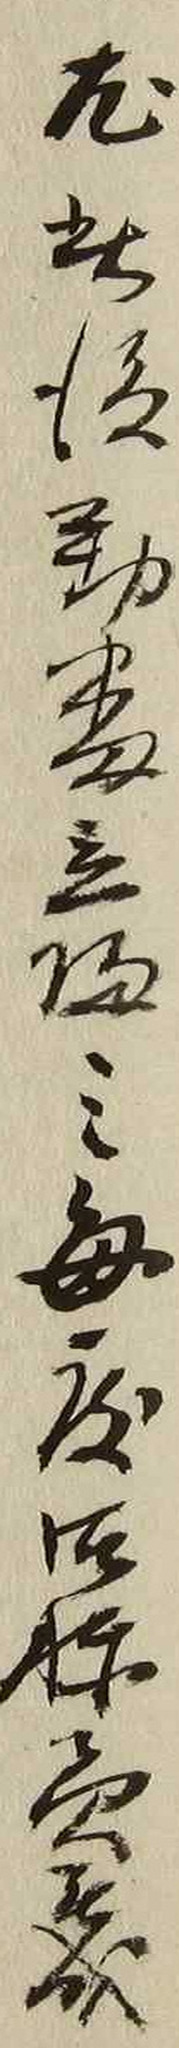尤此後勤番立帰之毎度御称美被成
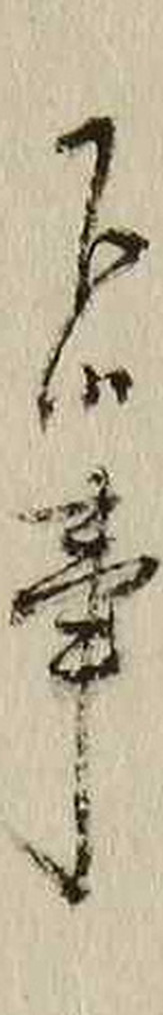下候事
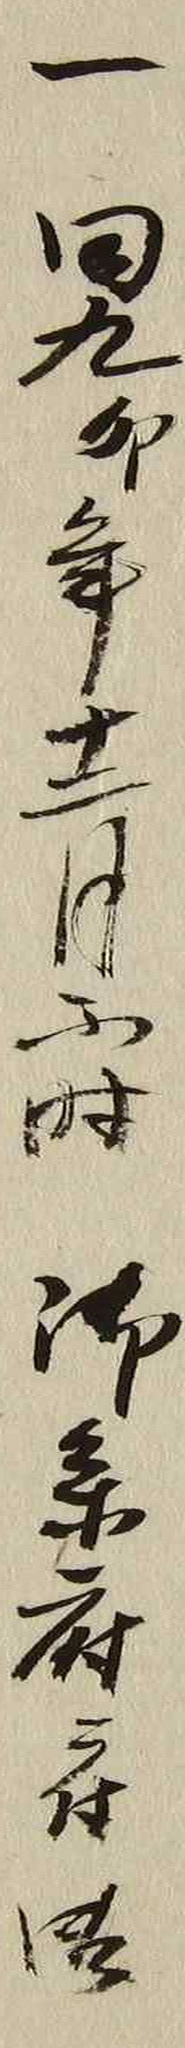一同九卯年三月不時御参府ニ付御
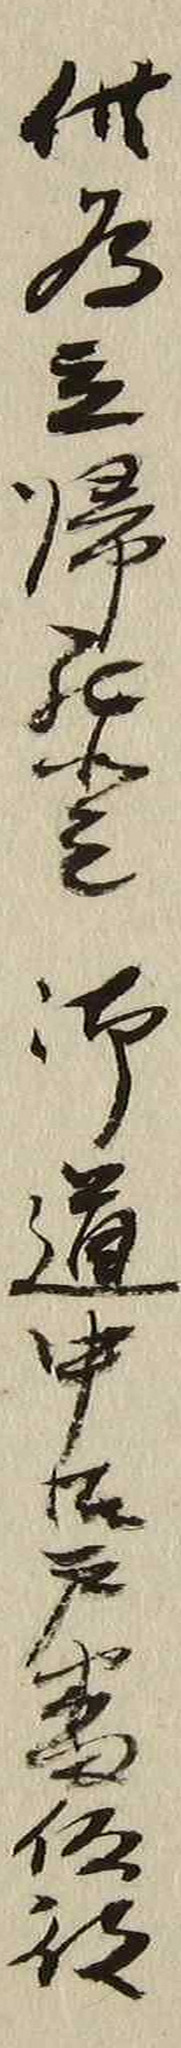供為立帰罷登御道中御戸番仮役
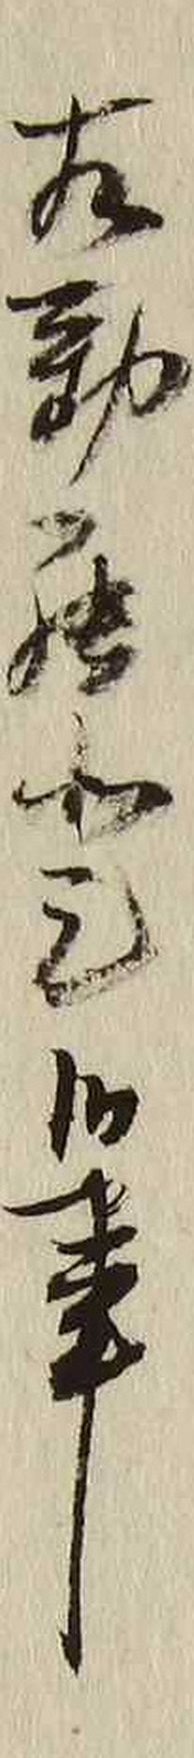相勤罷登候事
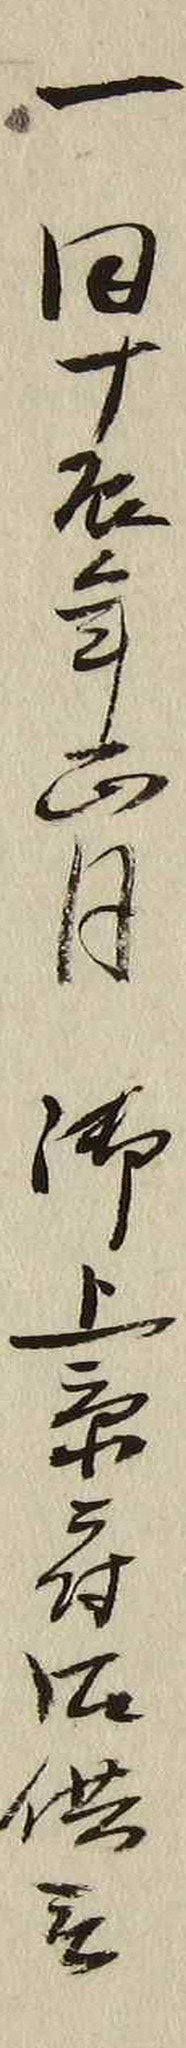一同十辰年正月御上京ニ付御供被
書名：諸士系譜　巻之345　も之部1
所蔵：会津若松市立会津図書館
